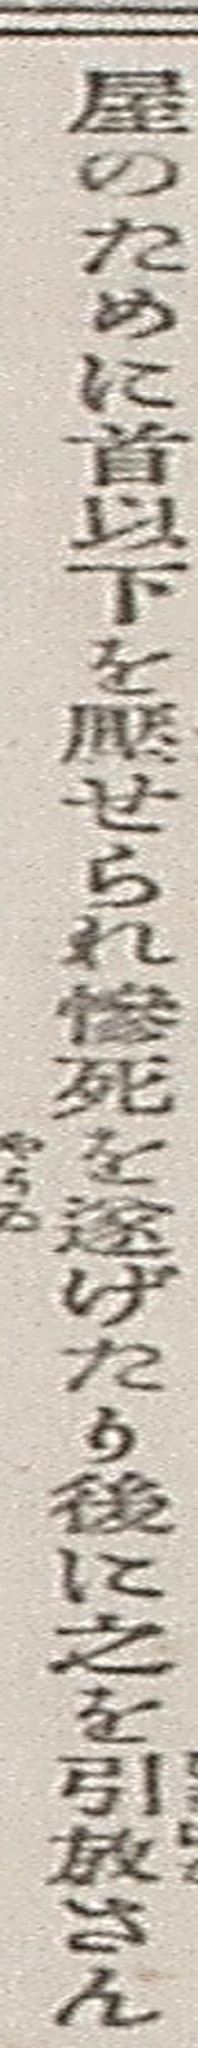屋のために首以下を壓せられ惨死遂げたり後に之を引放さん
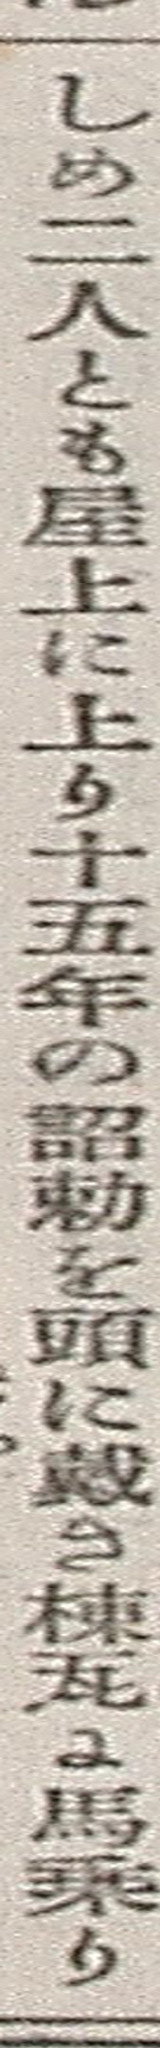しめ二人とも屋上に上り十五年の詔勅を頭に載き棟瓦に馬乗り
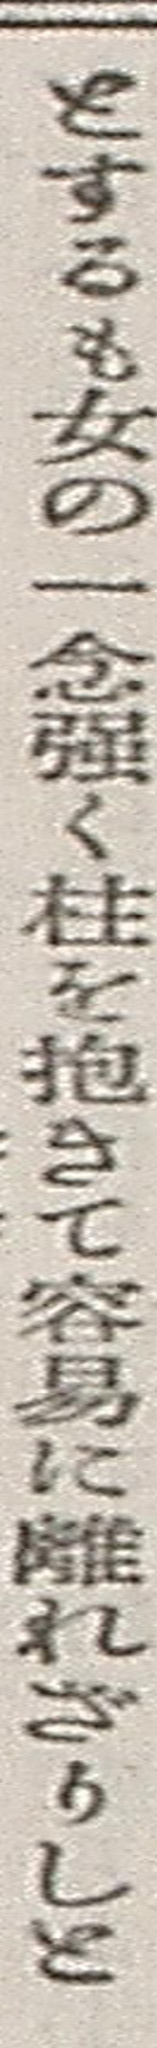とするも女の一念強く柱を抱きて容易に離れざりしと
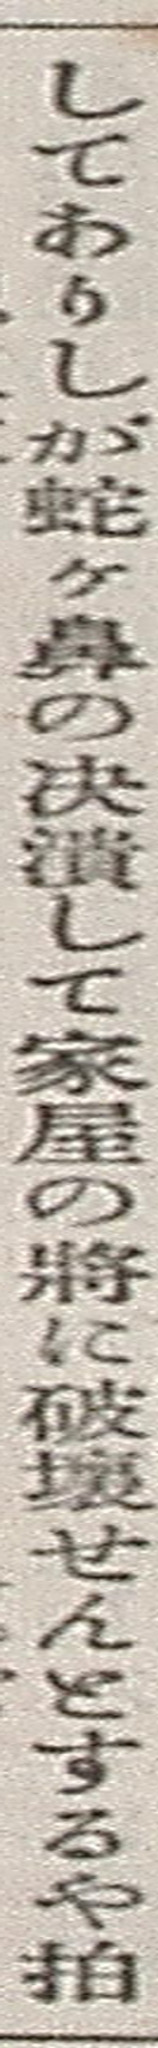してありしが蛇ヶ鼻の决潰して家屋の将に破壊せんとするや拍
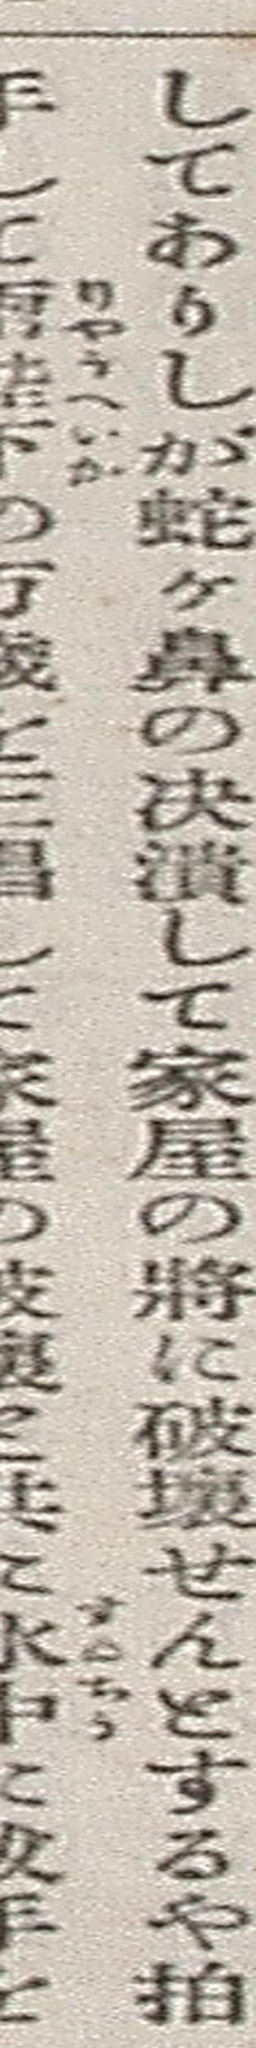手して両陛下の万歳を三唱して家屋の破壊と共に水中に抜手を
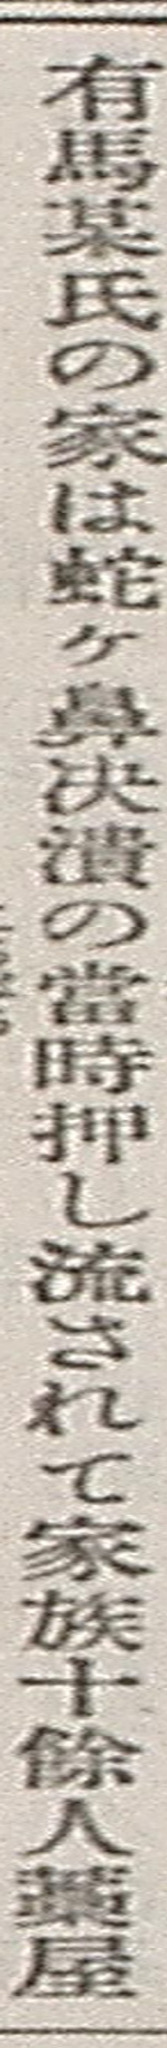有馬某氏の家は蛇ヶ鼻决潰の当時押し流されて家族十餘人藁屋
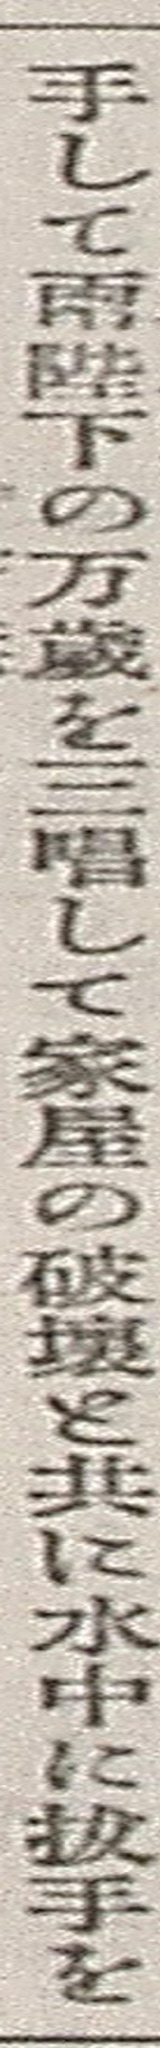手して両陛下の万歳を三唱して家屋の破壊と共に水中に抜手を
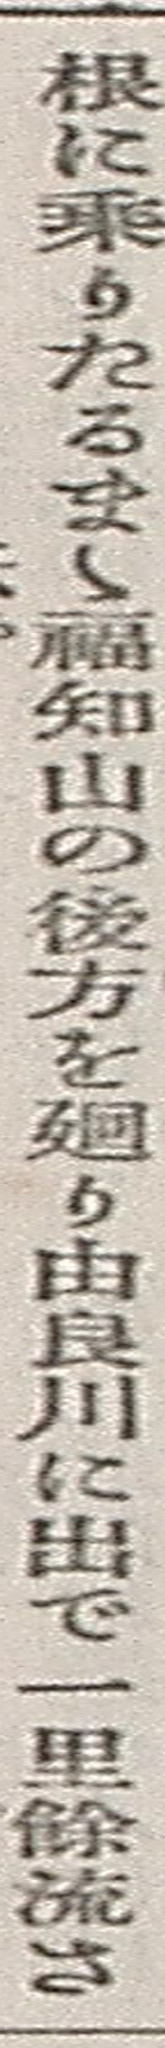根に乗りたるまゝ福知山の後方を廻り由良川に出で一里餘流さ
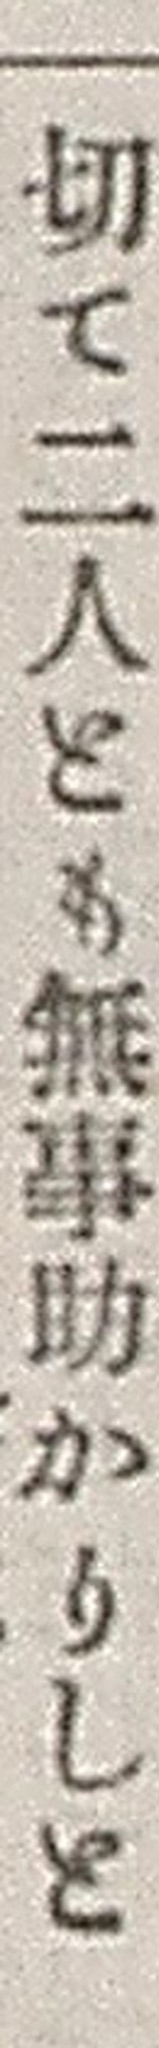切て二人とも無事助かりしと
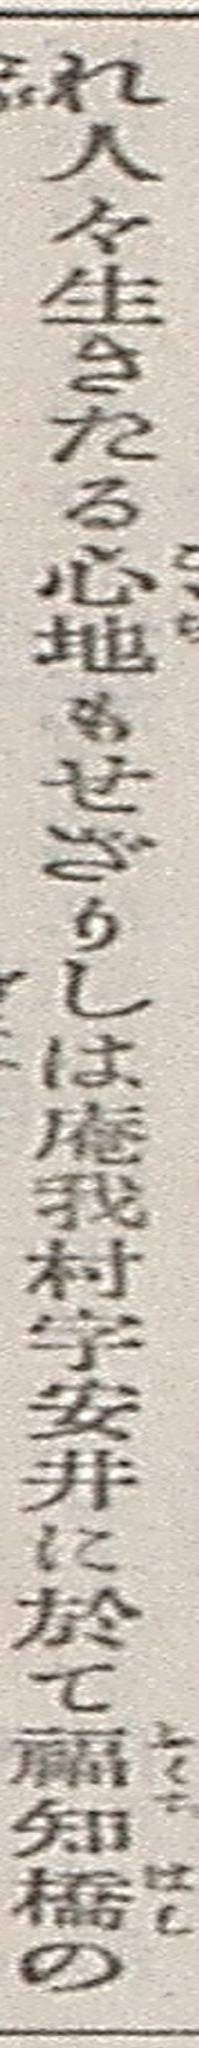れ人々生きたる心地もせざりしは庵我村字安井に於て福知橋の
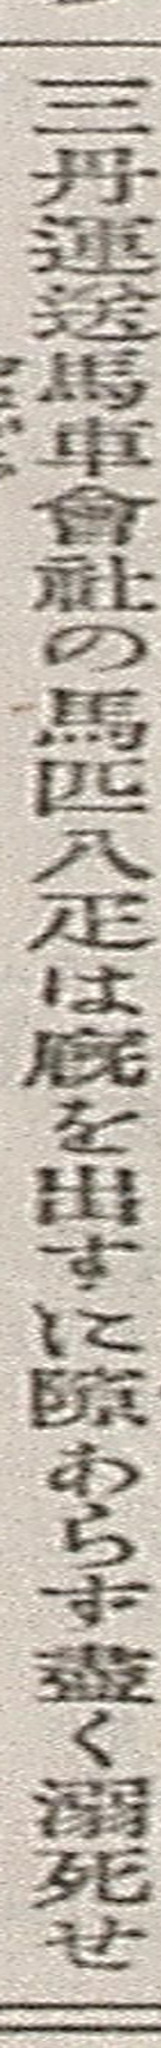三丹運送馬車會社の馬匹八疋は厩を出すに隙あらず盡く溺死せ
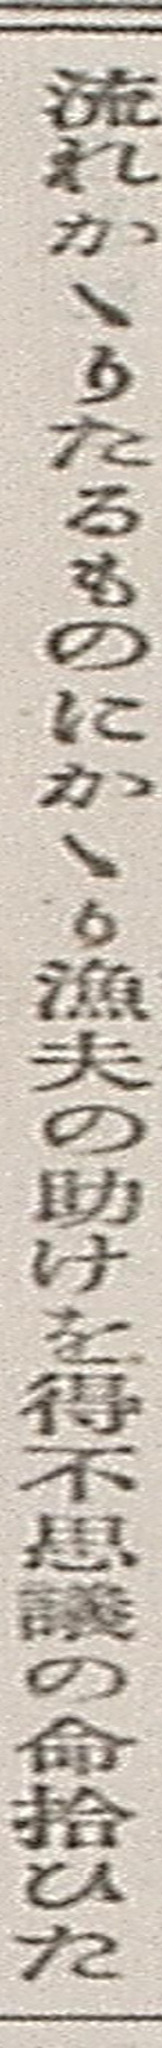流れかゝりたるものにかゝり漁夫の助を得不思議の命拾ひた
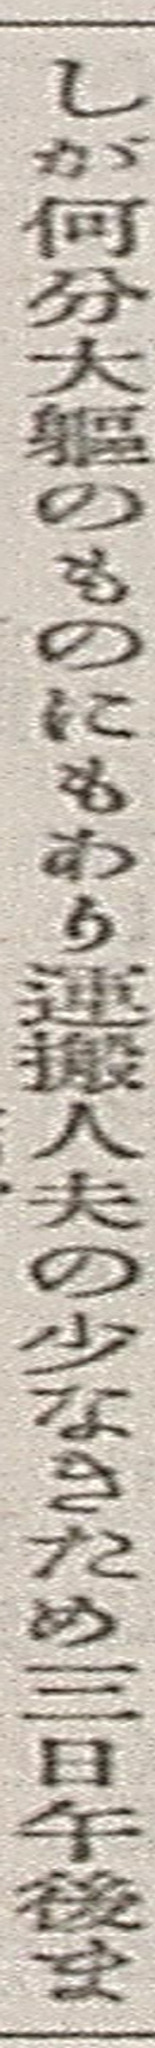しが何分大軀のものにもあり運搬人夫の少なきため三日午後ま
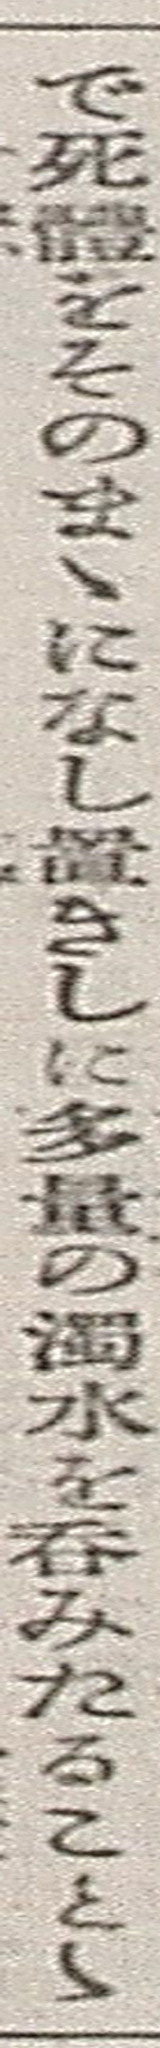で死体をそのまゝになし置きしに多量の濁水を吞みたることゝ
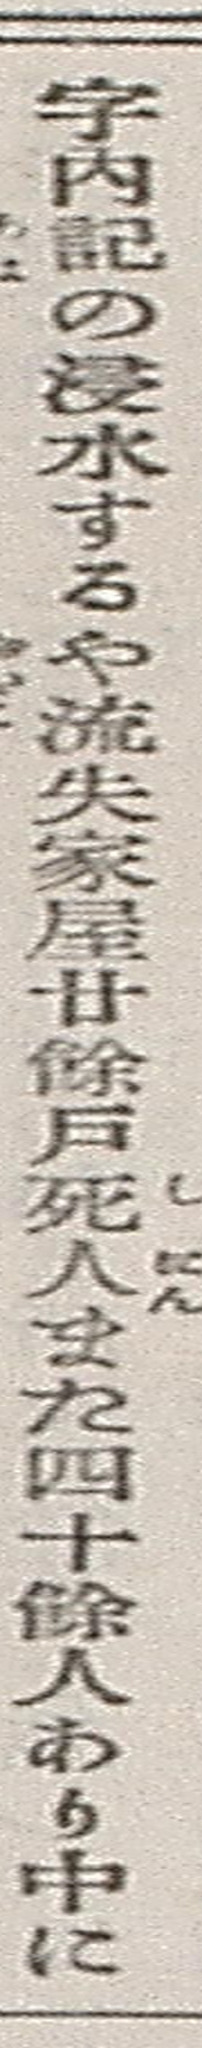宇内記の浸水するや流失家屋廿餘戸死人また四十餘人あり中に
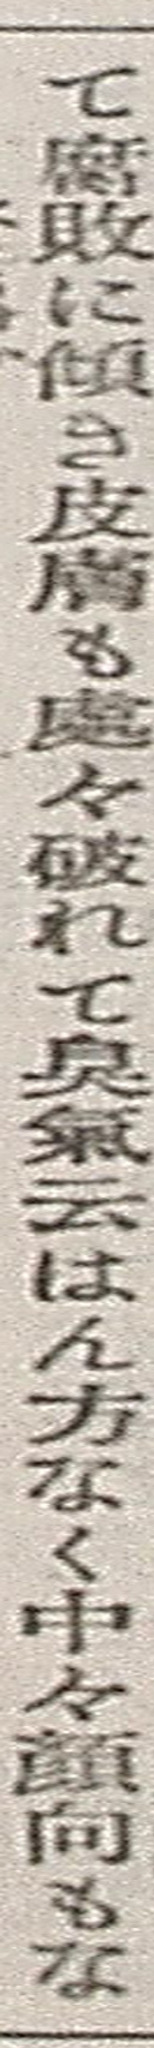て腐敗に傾き皮膚も処々破れて臭気云はん方なく中々顔向もな
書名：風俗畫報臨時増刊第百二十六號　洪水被害録（中）
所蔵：東京大学地震研究所図書室 Earthquake Research Institute Library, The University of Tokyo, JAPAN
